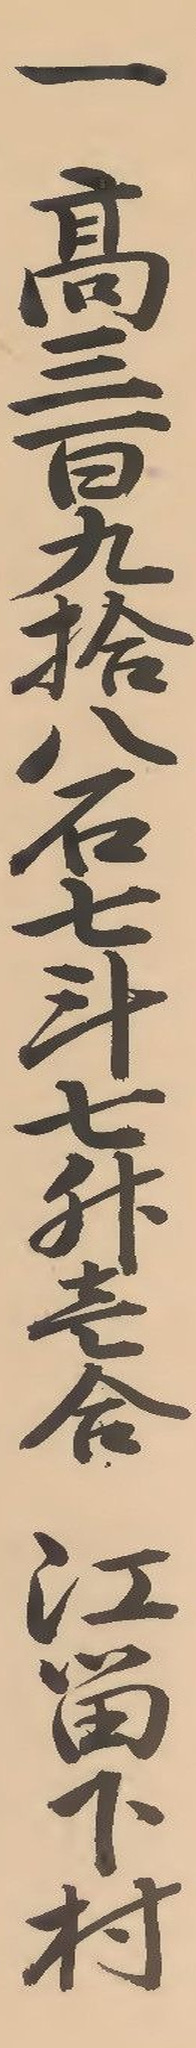一高三百九拾八石七斗七升壱合江留下村
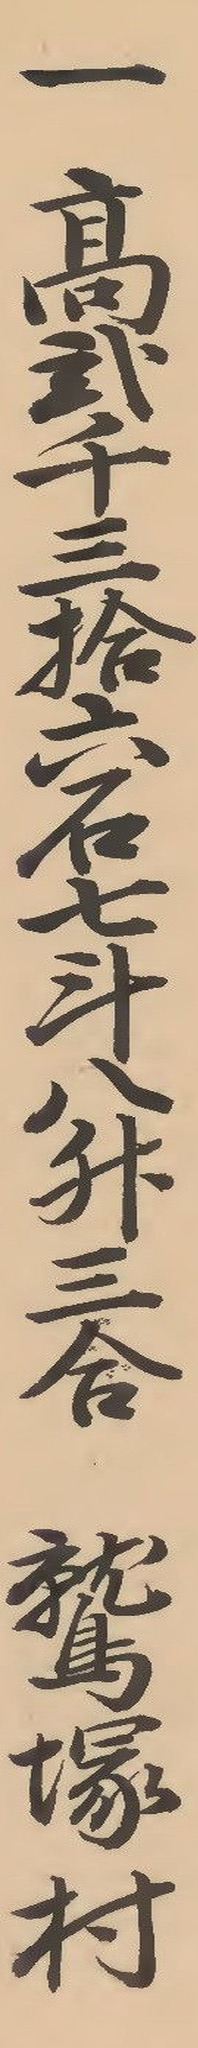一高弐千三拾六石七斗八升三合鷲塚村
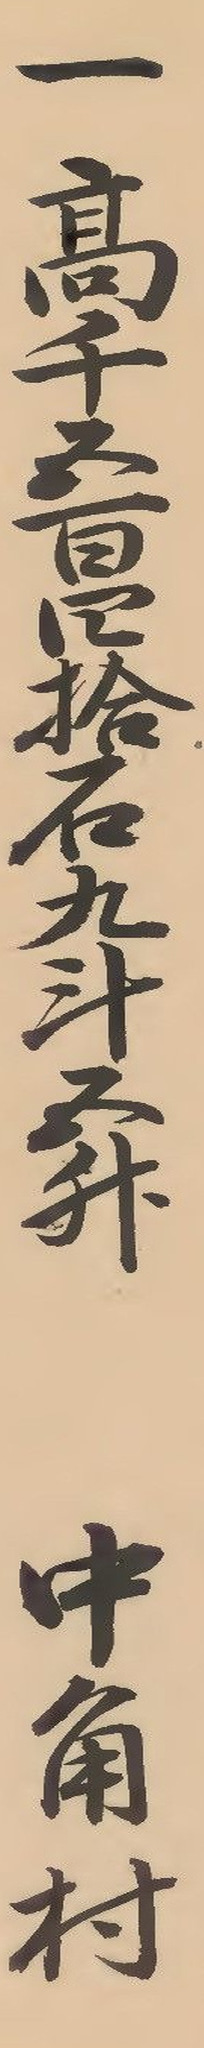一高千五百四拾石九斗五升中角村
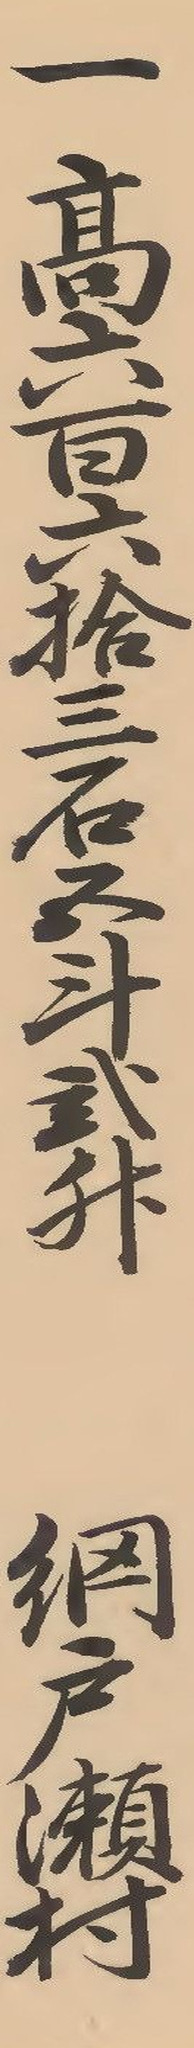一高六百六拾三石五斗弐升網戸瀬村

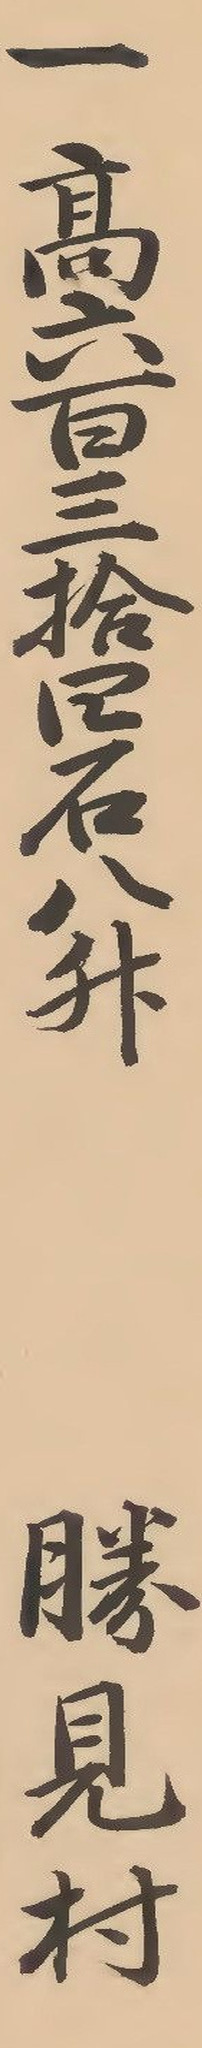一高六百三拾四石八升勝見村
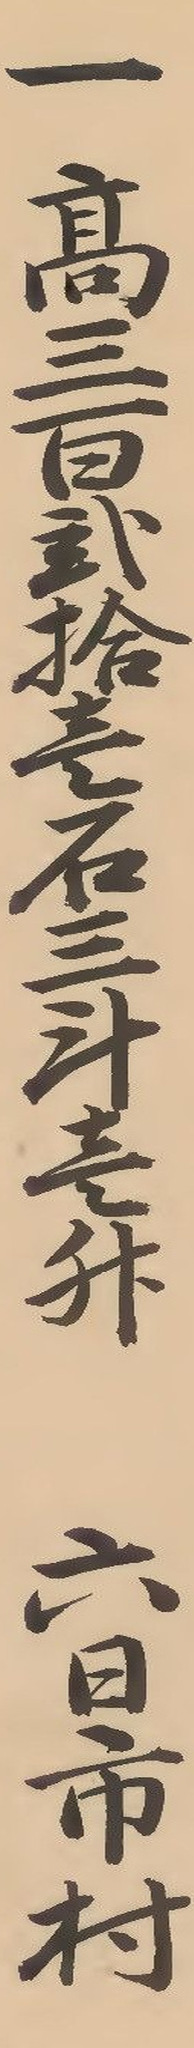一高三百弐拾壱石三斗壱升六日市村
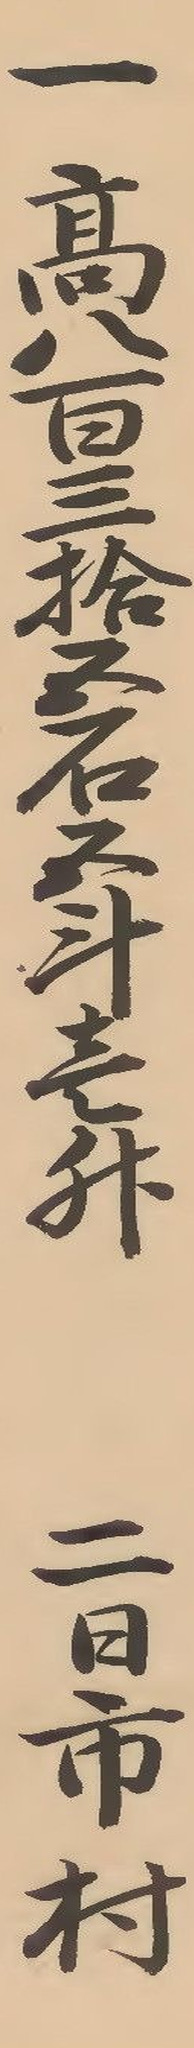一高八百三拾五石五斗壱升二日市村
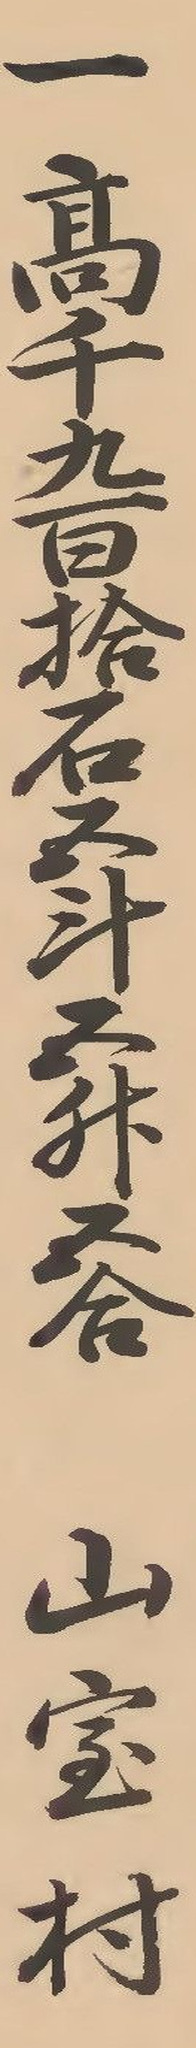一高千九百拾石五斗五升五合山室村
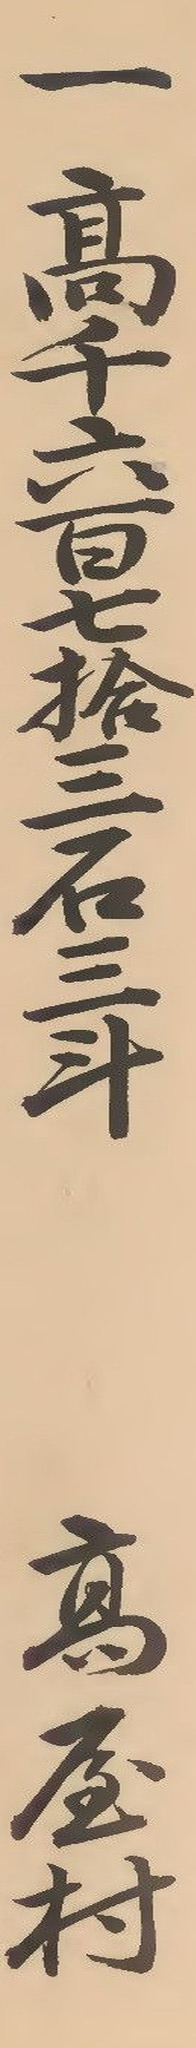一高千六百七拾三石三斗高屋村
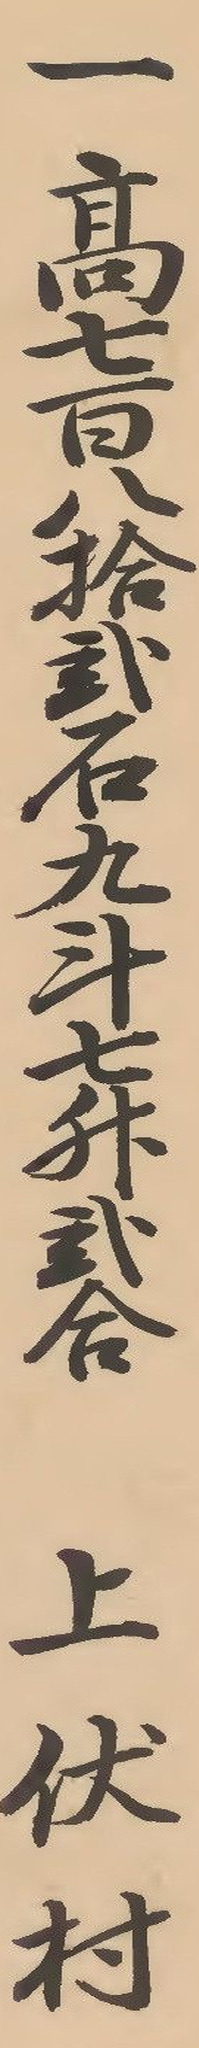一高七百八拾弐石九斗七升弐合上伏村
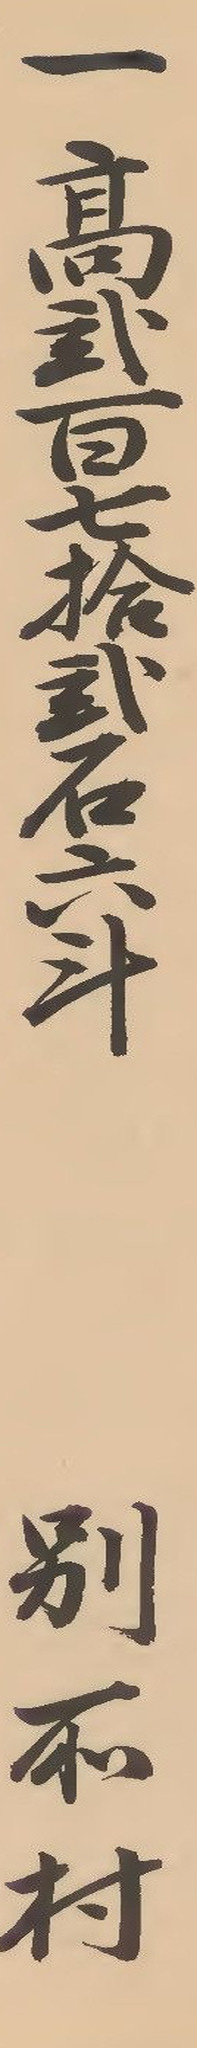一高弐百七拾弐石六斗別所村
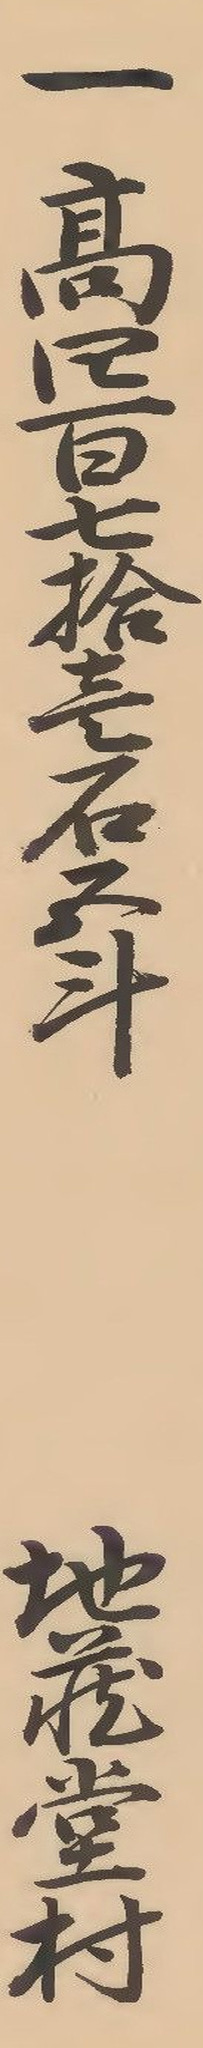一高四百七拾壱石五斗地蔵堂村

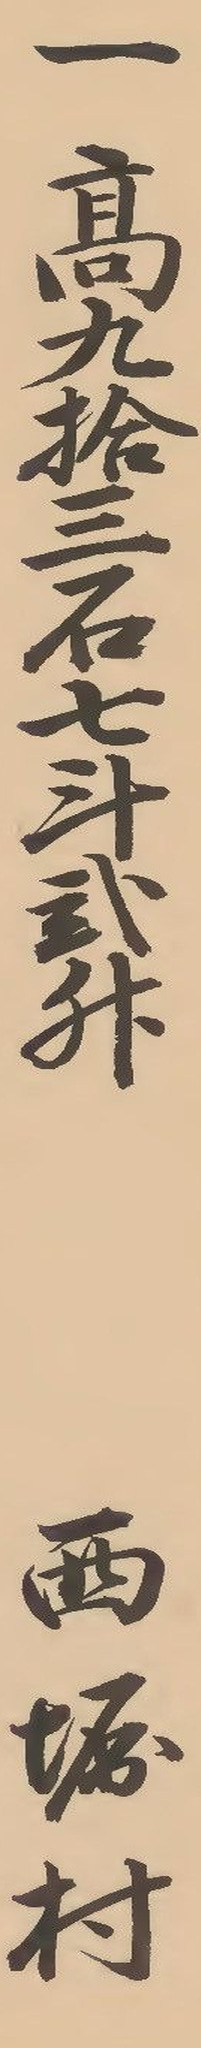一高九拾三石七斗弐升西堀村
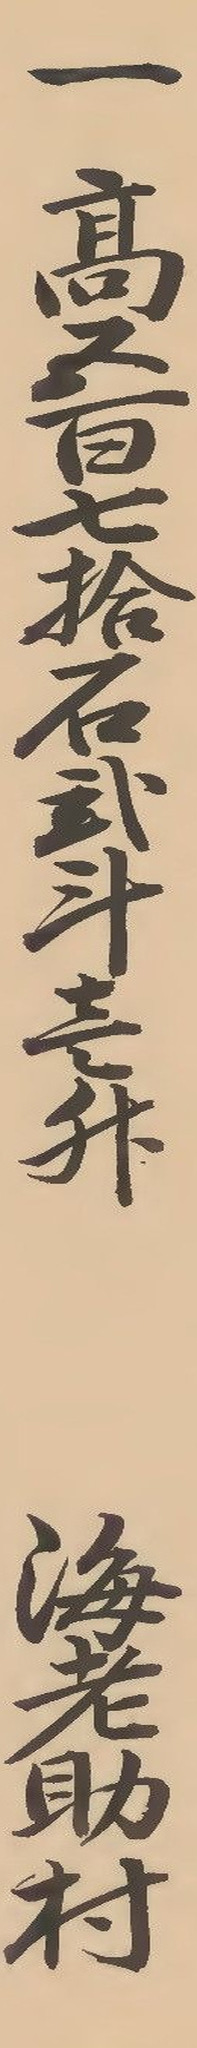一高五百七拾石弐斗壱升海老助村
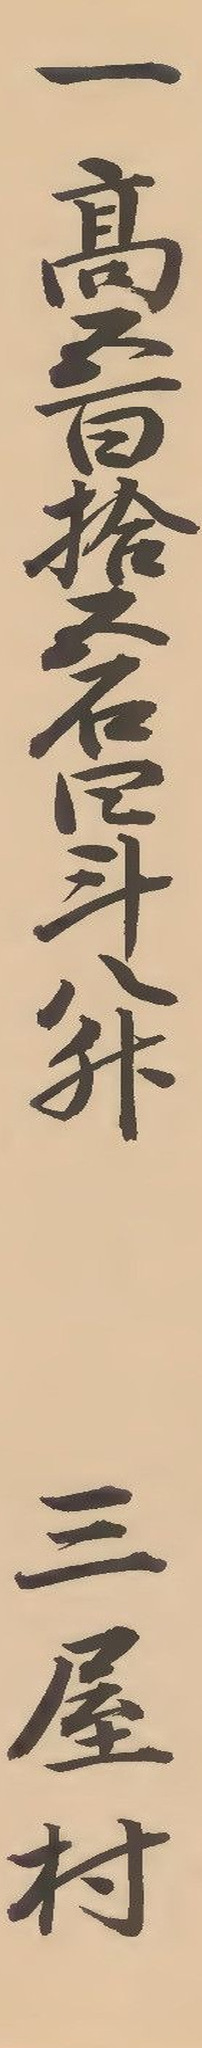一高五百拾五石四斗八升三屋村
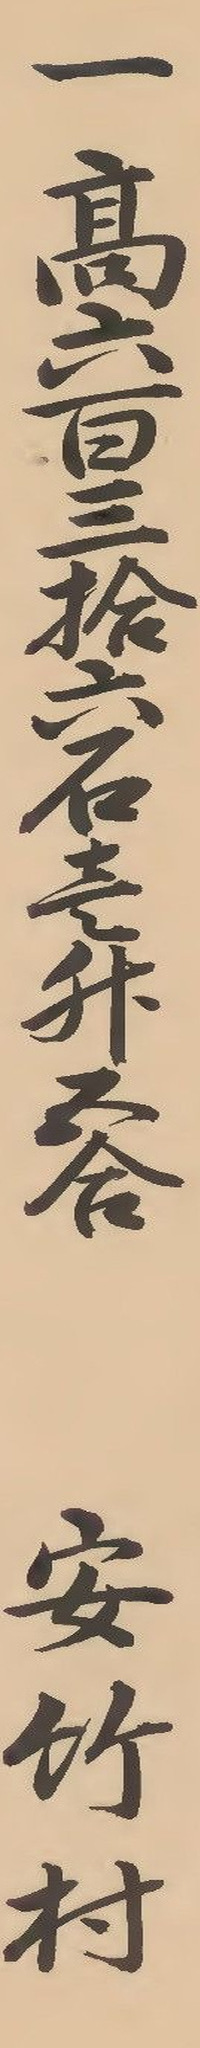一高六百三拾六石壱升五合安竹村
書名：越前国郷帳
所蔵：国立公文書館 National Archives of Japan
